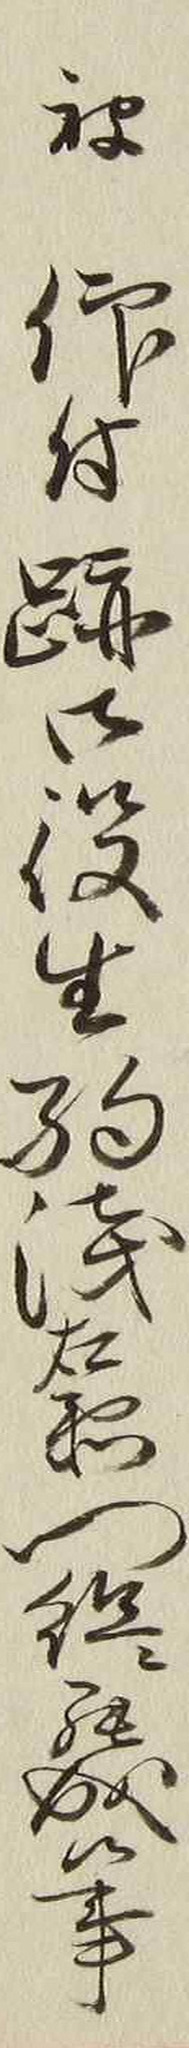被仰付跡御役生駒浅右衛門組ニ罷成候事
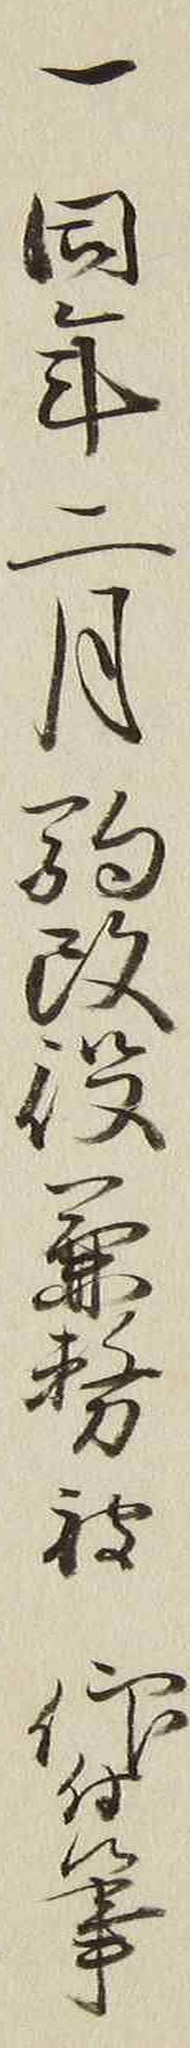一同年二月駒改役兼務被仰付候事
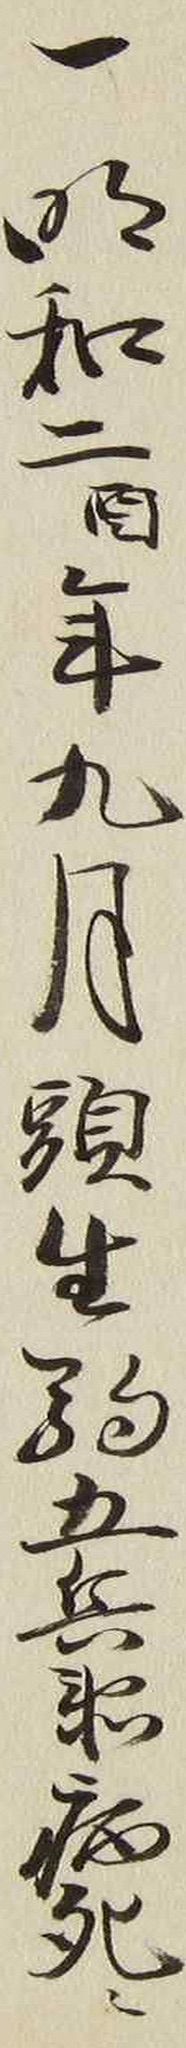一明和二酉年九月頭生駒五兵衛病死ニ
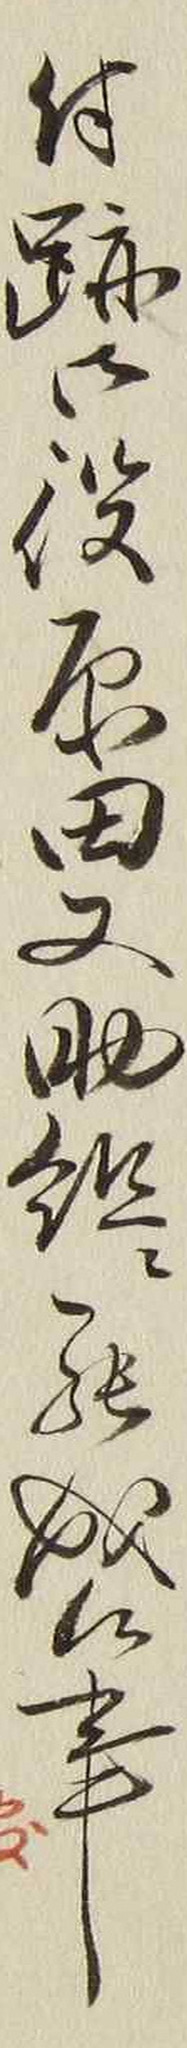付跡御役原田又助組ニ罷成候事
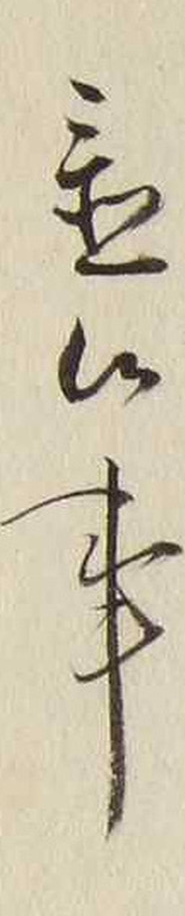置候事

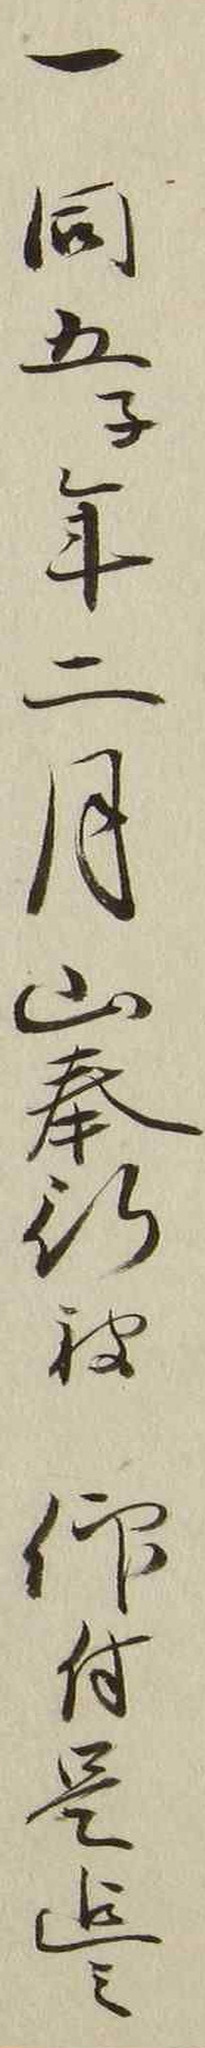一同五子年二月山奉行被仰付是迄之
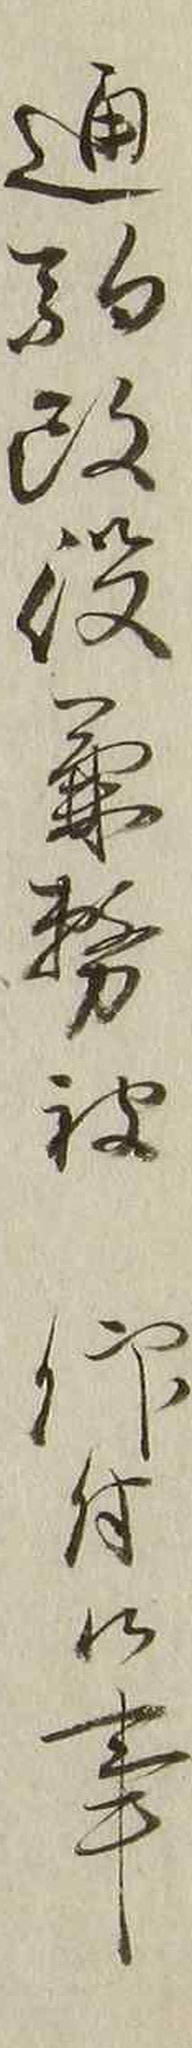通駒改役兼務被仰付候事
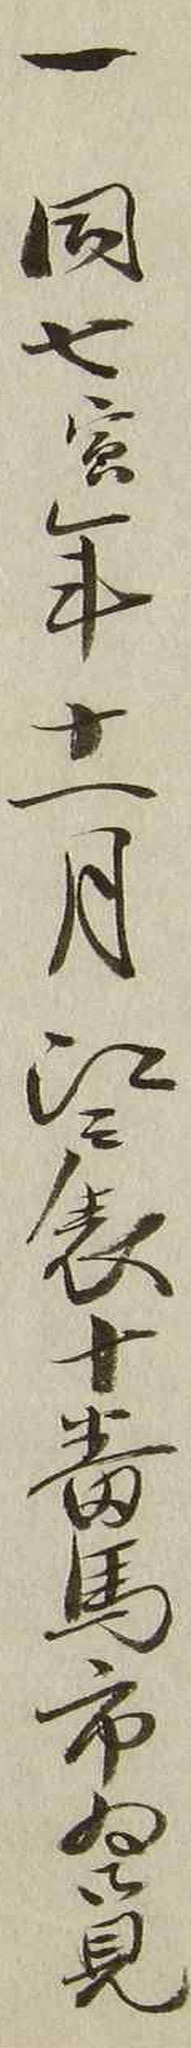一同七寅年十一月江戸表十番馬市為御見
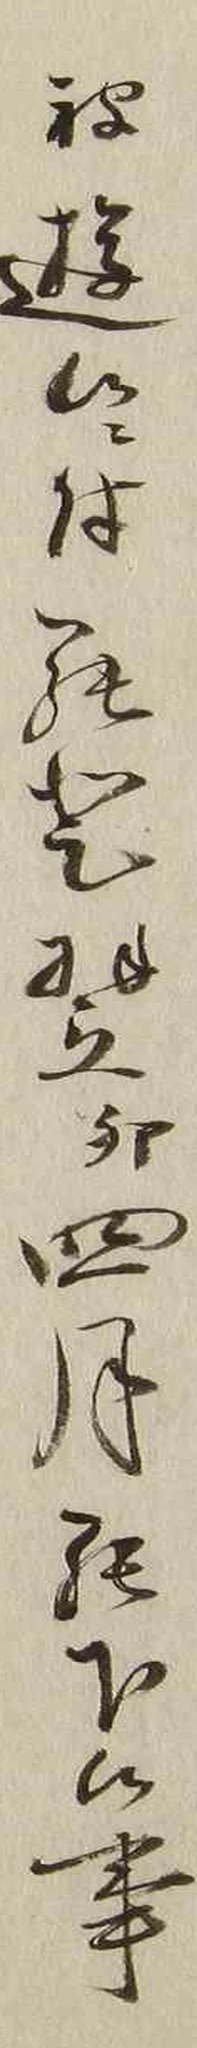被遊候ニ付罷登翌卯四月罷下候事
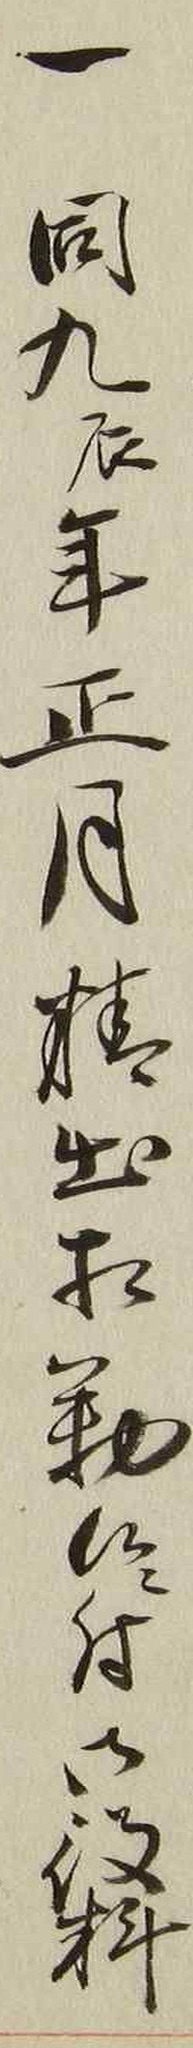一同九辰年正月精出相勤候ニ付御役料
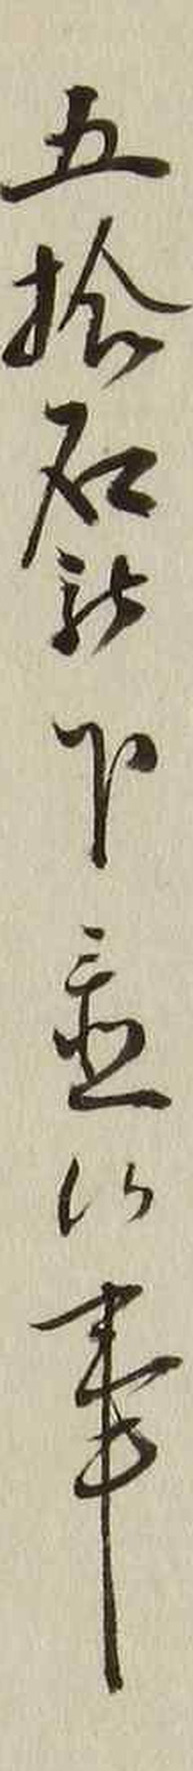五拾石被下置候事
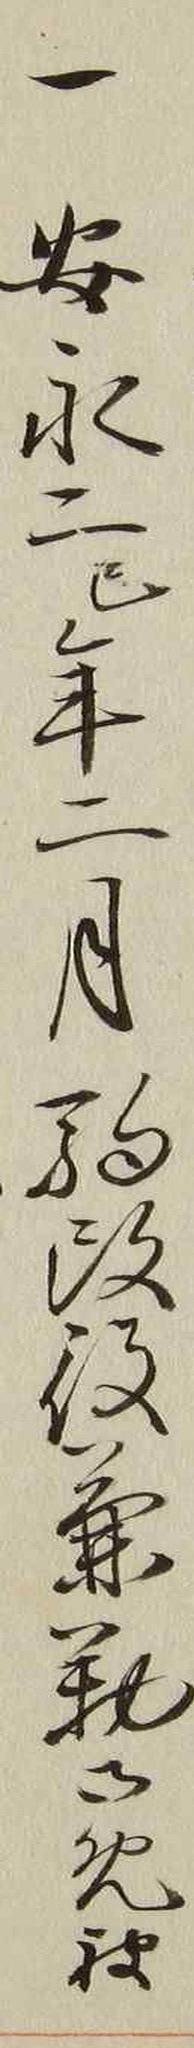一安永二巳年二月駒改役兼勤御免被
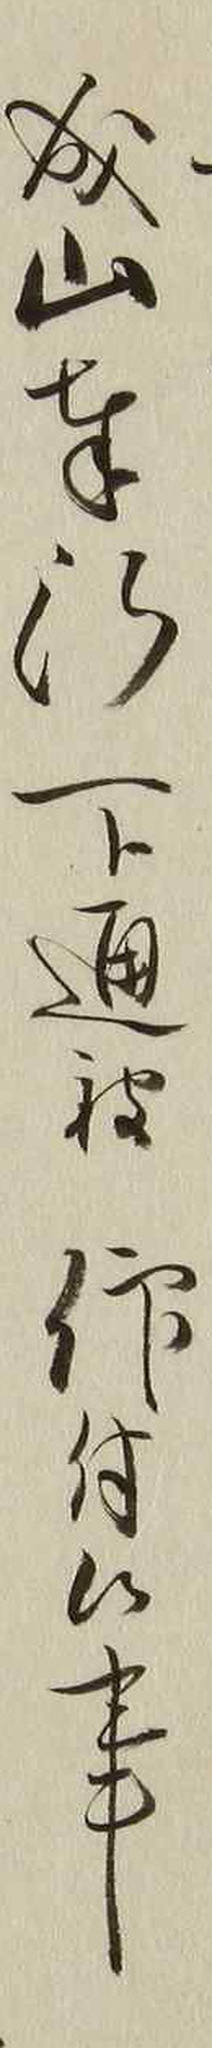成山奉行一ㇳ通被仰付候事
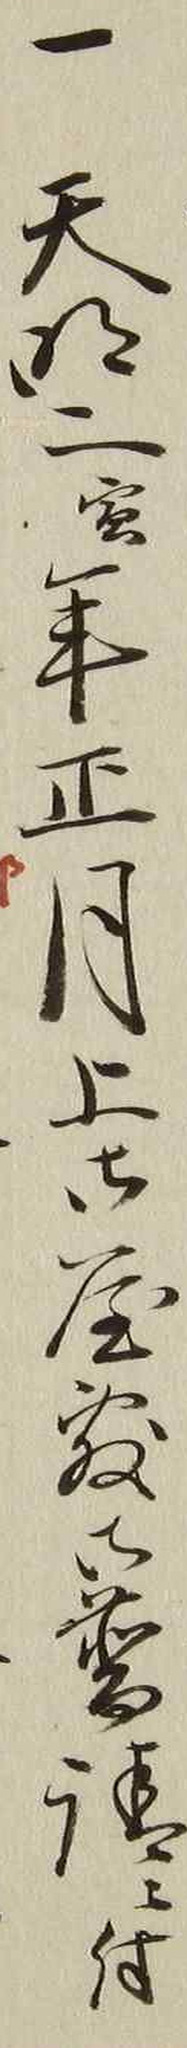一天明二寅年正月上御屋敷御普請ニ付
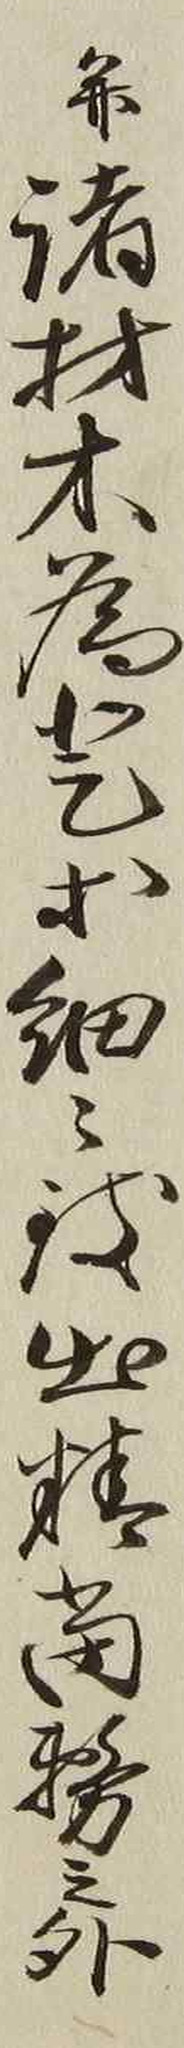幷諸材木為登等細々致出精当務之外
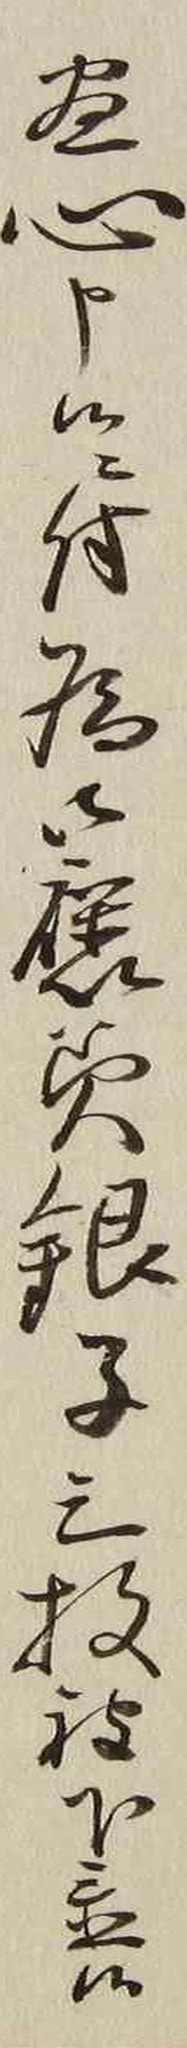尽心申候ニ付為御褒美銀子三枚被下置候
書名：諸士系譜　巻之163　な之部5
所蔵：会津若松市立会津図書館
